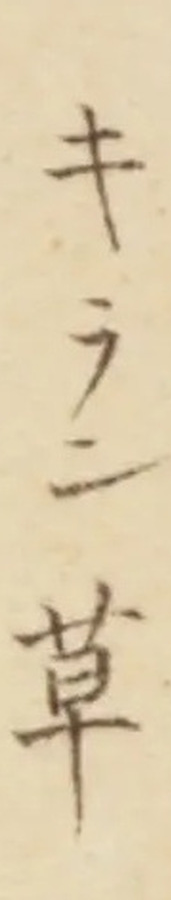キラン草
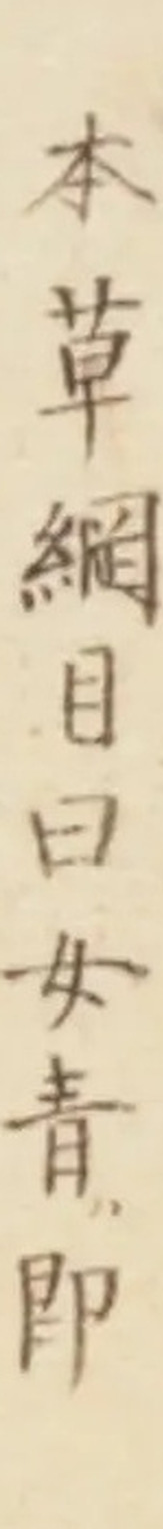本草綱目曰女青即
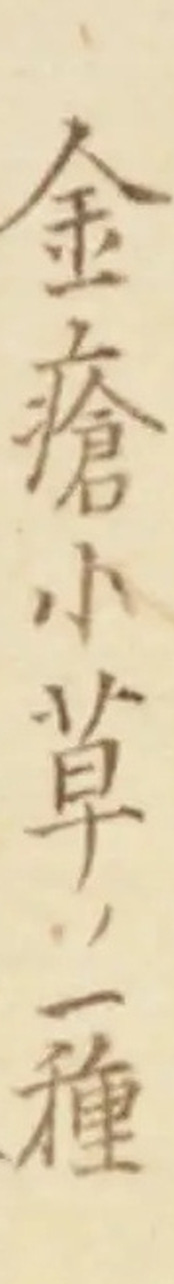金瘡小草一種
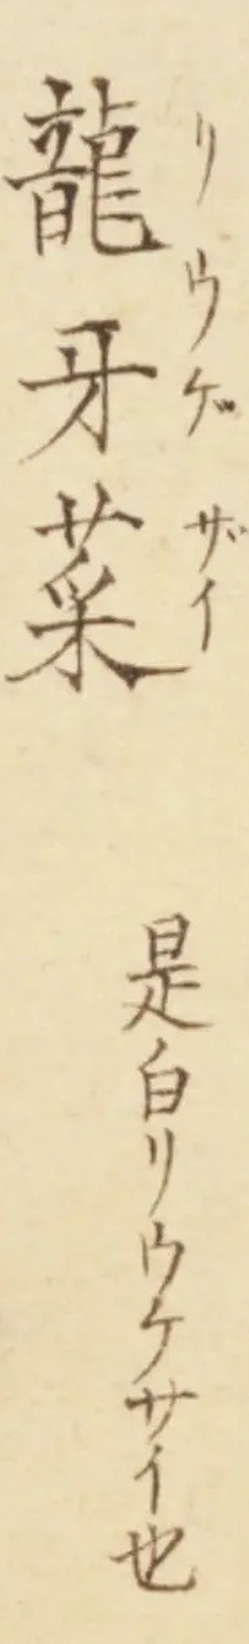竜牙菜是白リウケサイ也
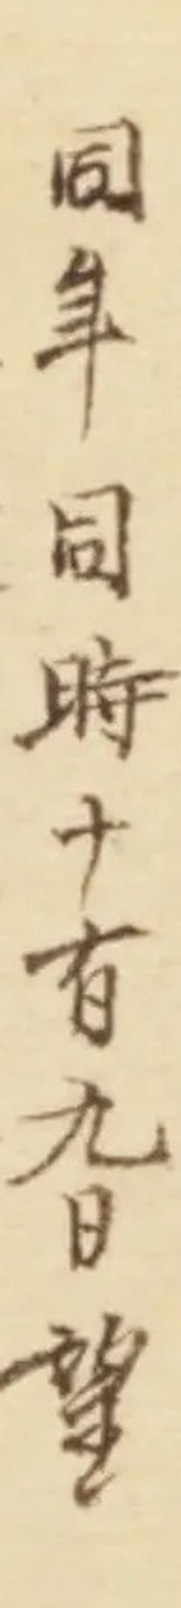同年同時十有九日望
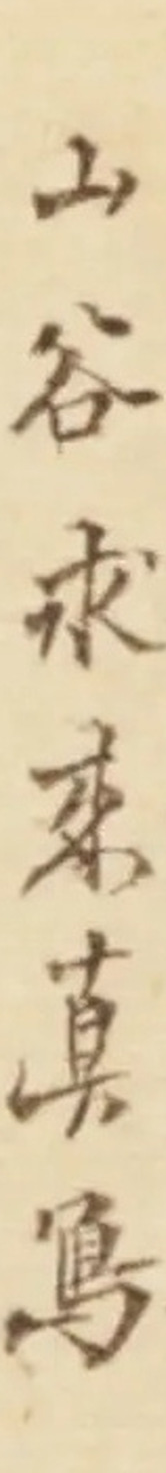山谷求来真写
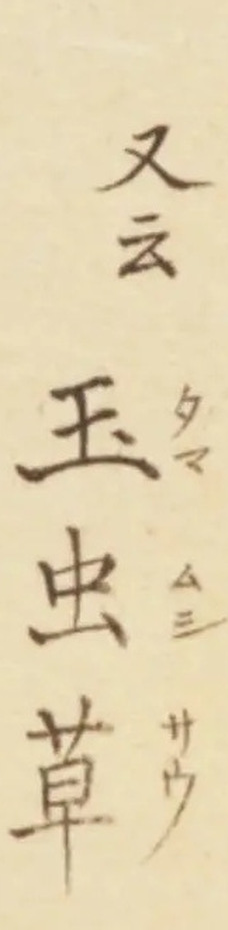又云玉虫草

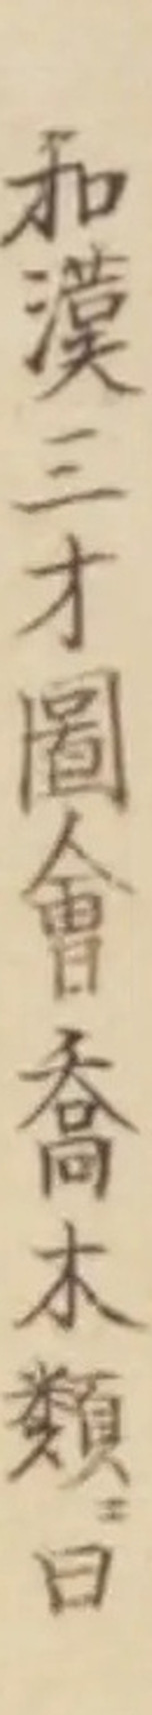和漢三才図会喬木類類曰
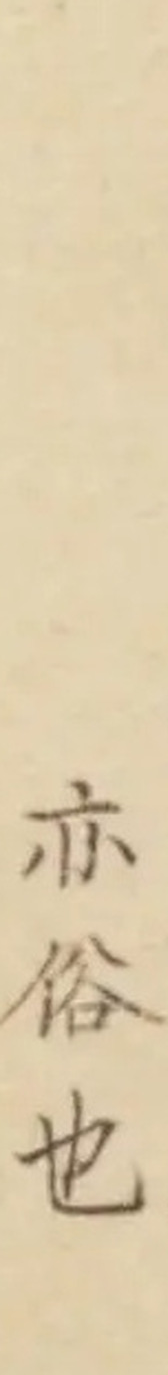亦俗也
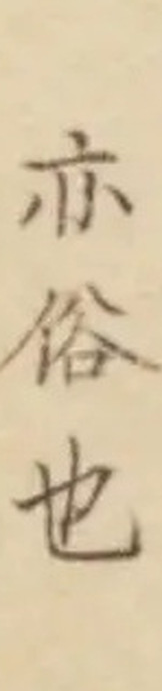亦俗也
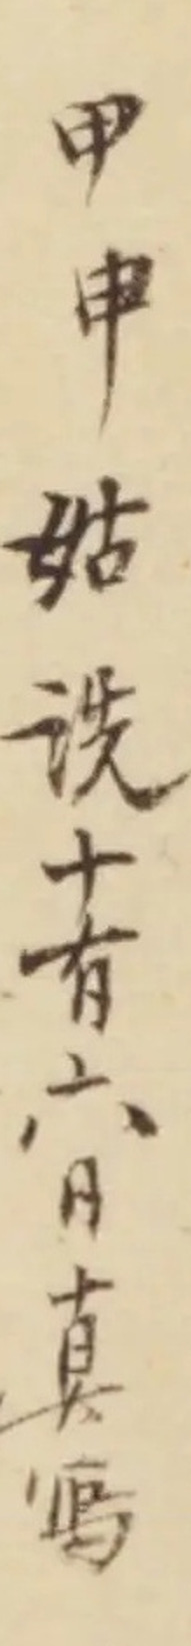甲申姑洗十有六日真写
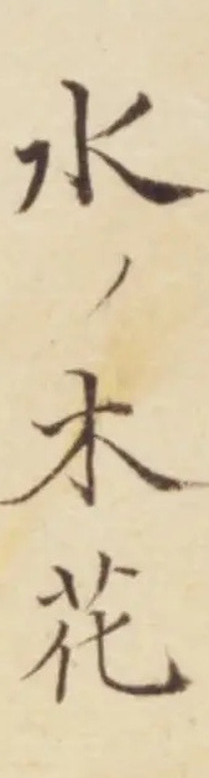水ノ木花

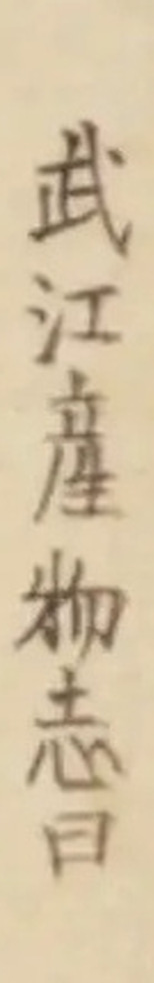武江産物志曰
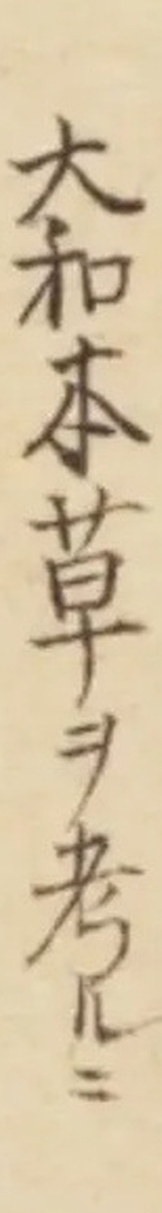大和本草ヲ考ルニ
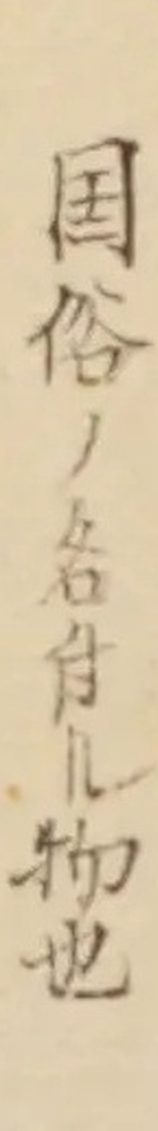国俗ノ名付ル物也
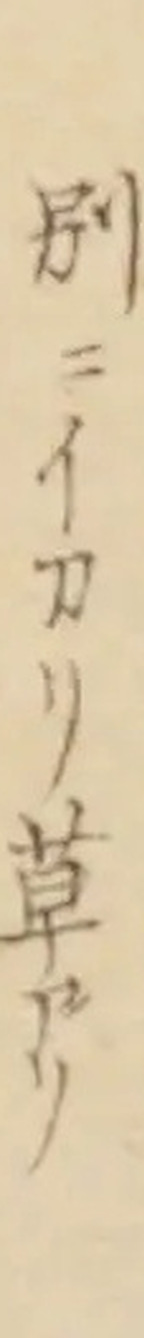別ニイカリ草アリ
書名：梅園草木花譜春之部. 1
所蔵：国立国会図書館 National Diet Library, JAPAN
